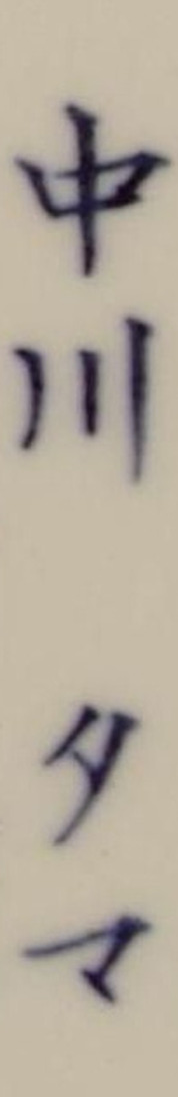中川タマ
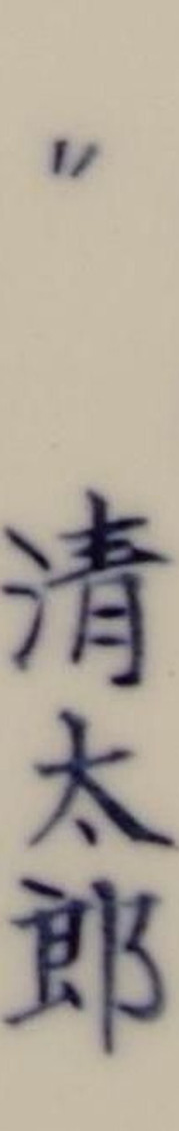清太郎
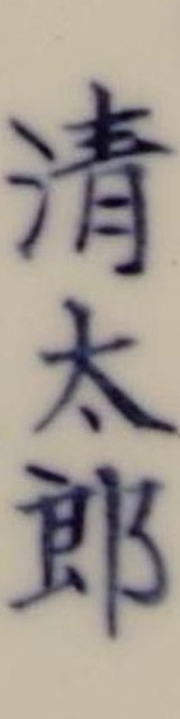清太郎
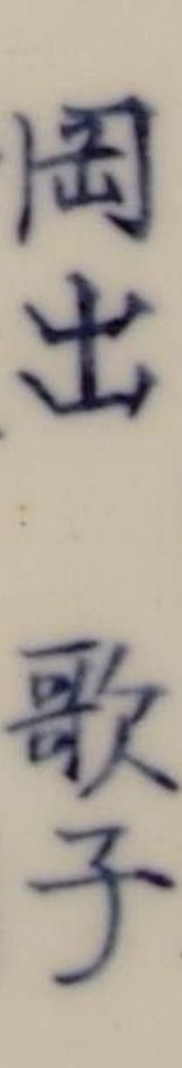岡出歌子
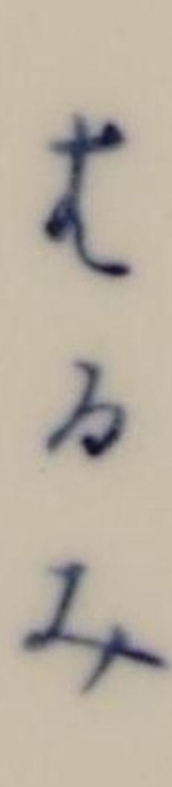はるみ
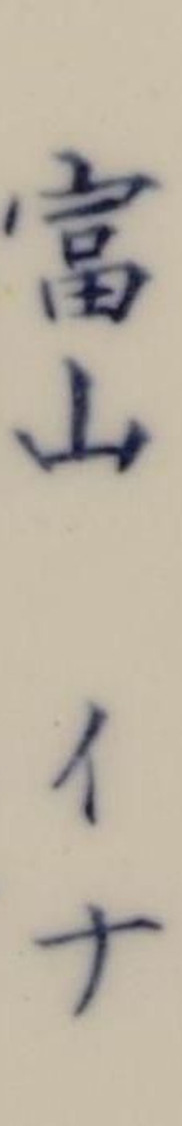富山イナ
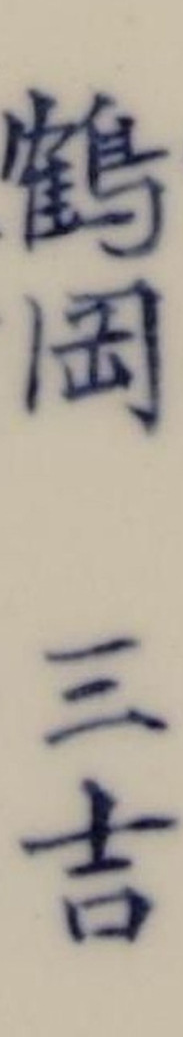鶴岡三吉
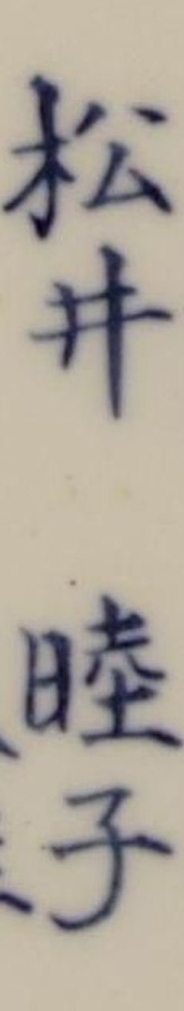松井睦子
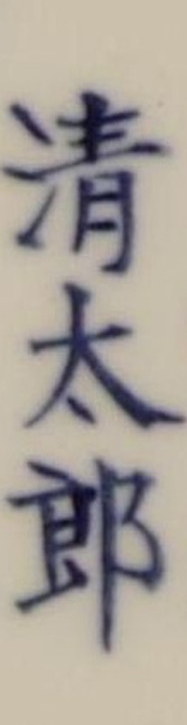清太郎
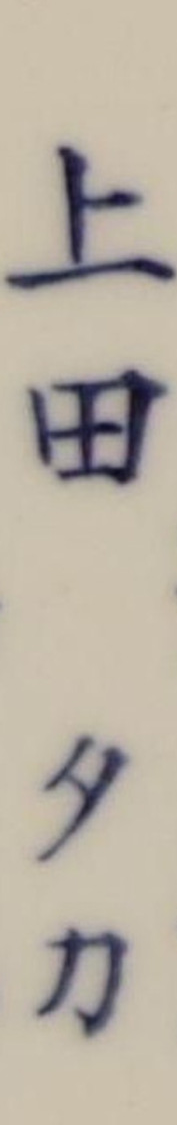上田タカ
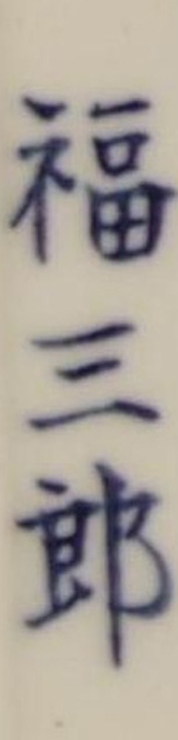福三郎

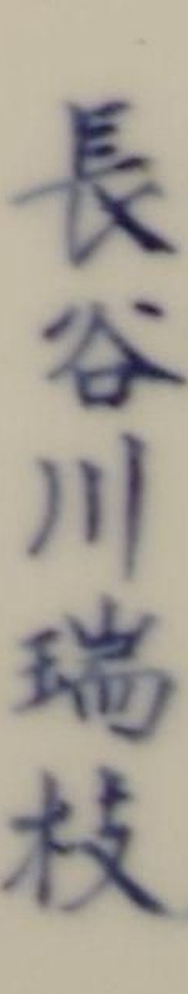長谷川瑞枝
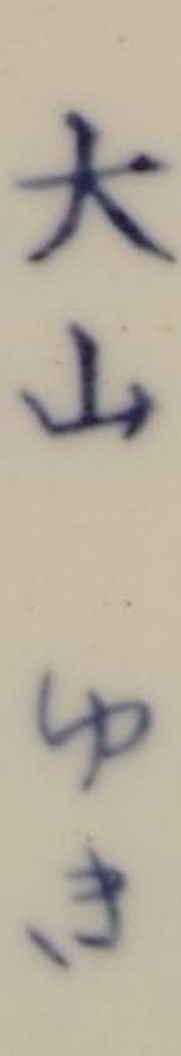大山ゆき
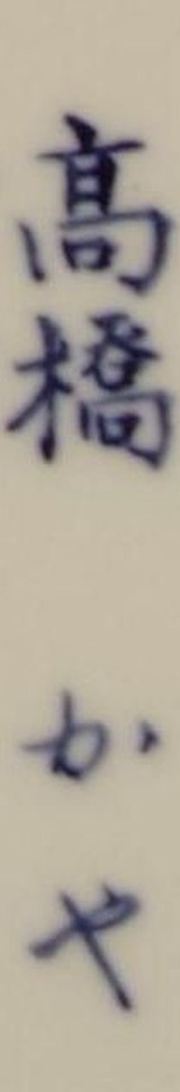高橋かや
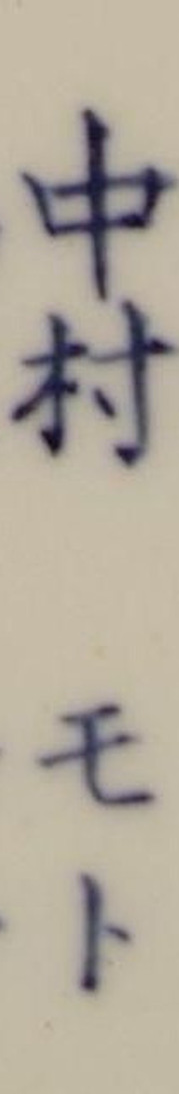中村モト
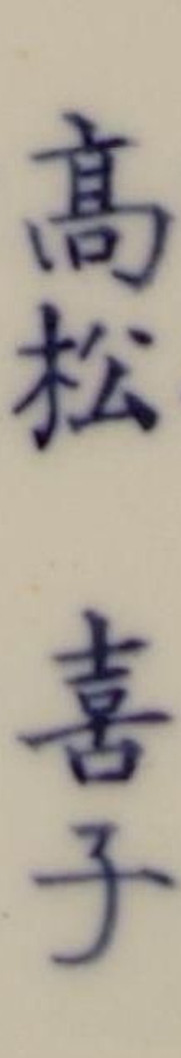高松喜子
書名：E~L
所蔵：高野山金剛峯寺
